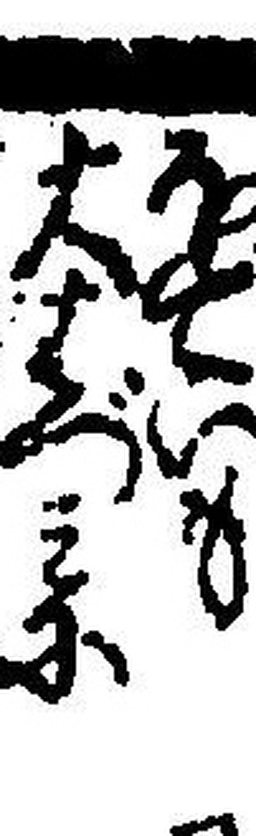大はづみに
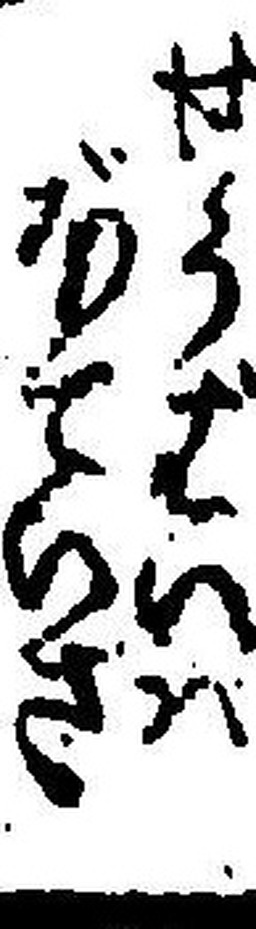ぼていさ
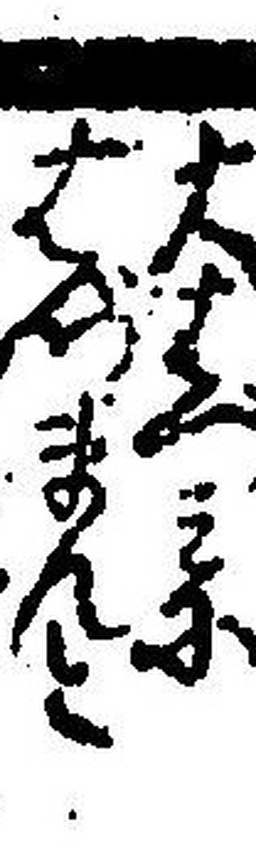はづまんと
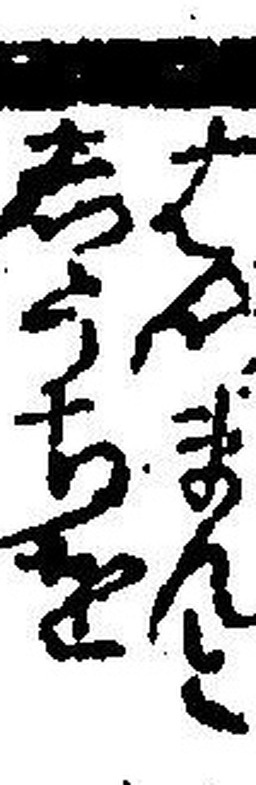しうちを
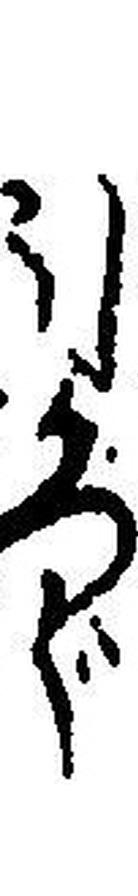引かつぐ
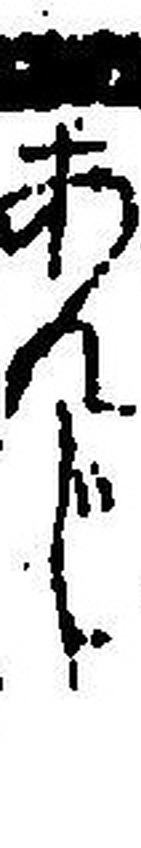あんじ
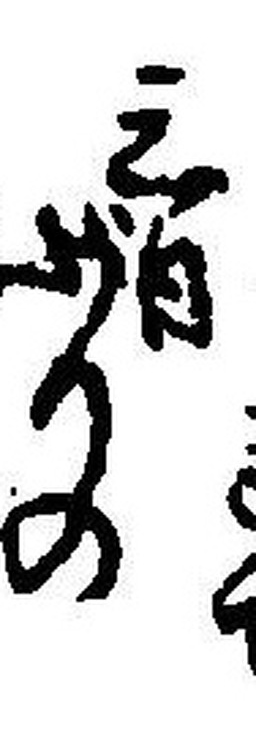ぶりの
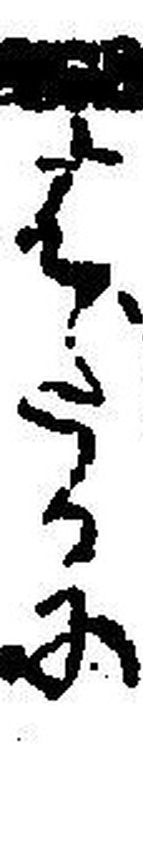はたかに
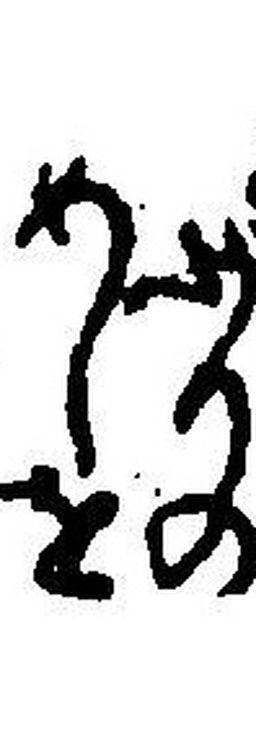めしを
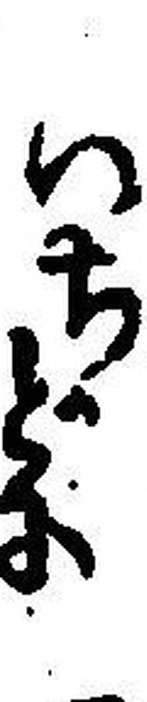いちどに
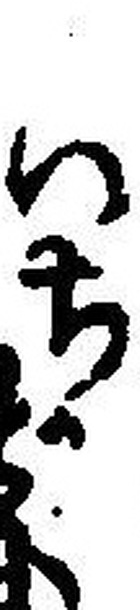いると
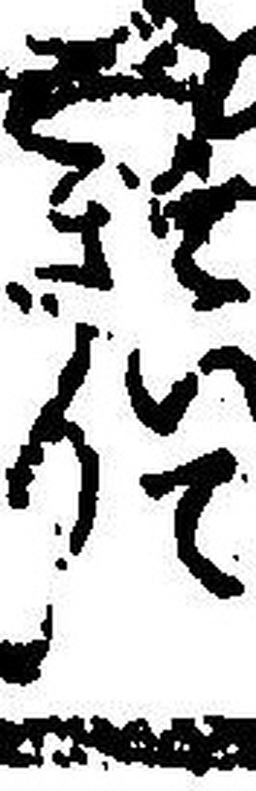こざり
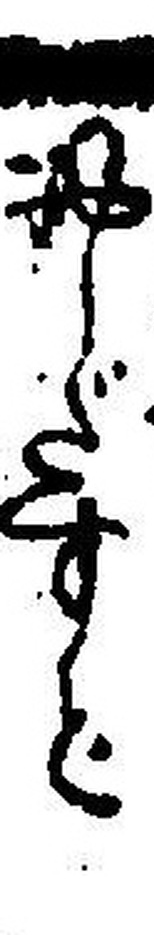おしだすと
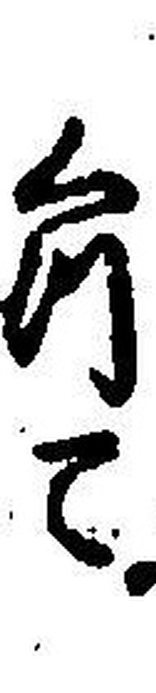くつて
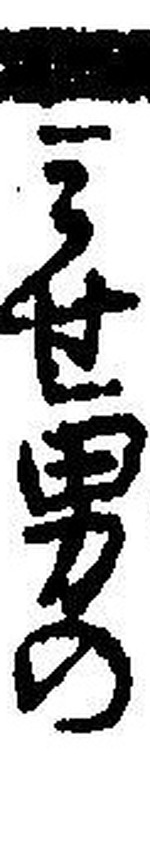みせ男の
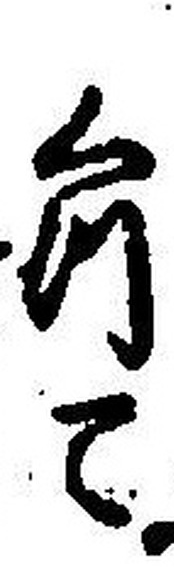くつて
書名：徳若水縁起金性 / 樹下石上作
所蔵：東京大学総合図書館 General Library in the University of Tokyo, JAPAN
